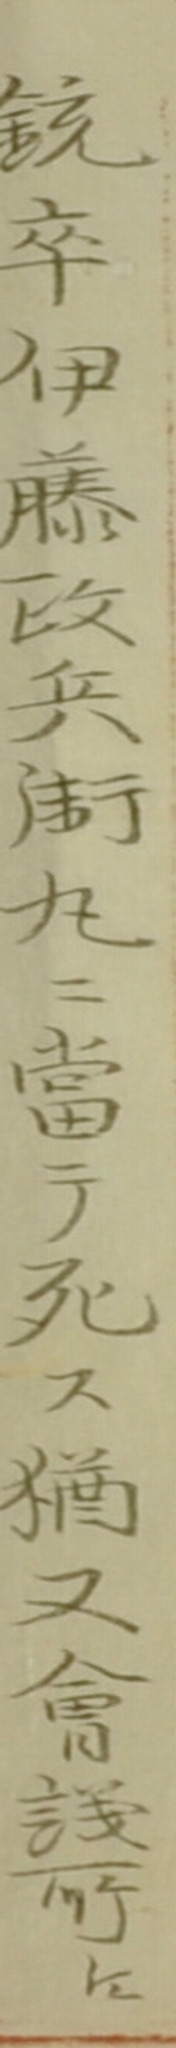銃卒伊藤政兵衛丸ニ当テ死ス猶又会議所江
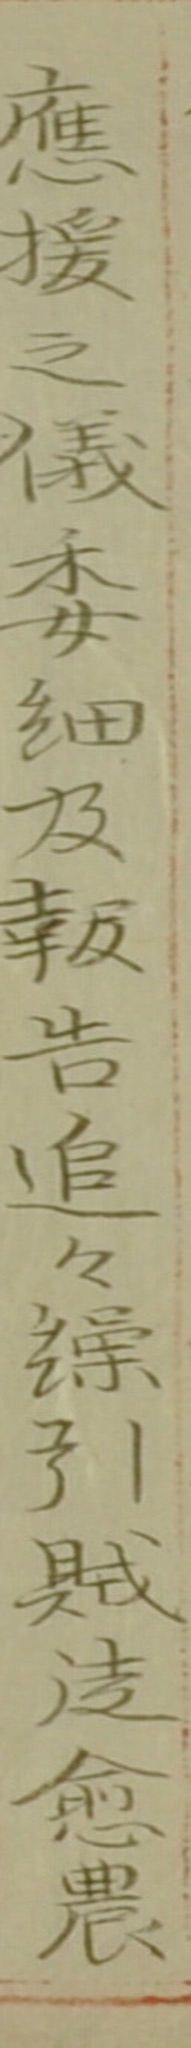応援之儀委細及報告追々繰引賊徒愈農
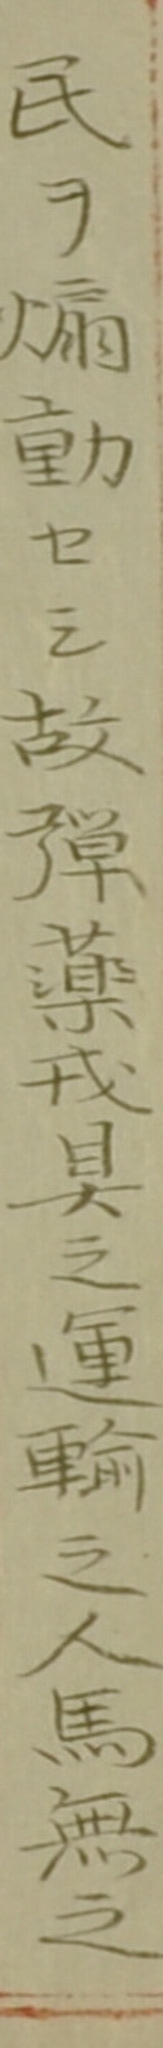民ヲ煽動セシ故弾薬戎具之運輸之人馬無之
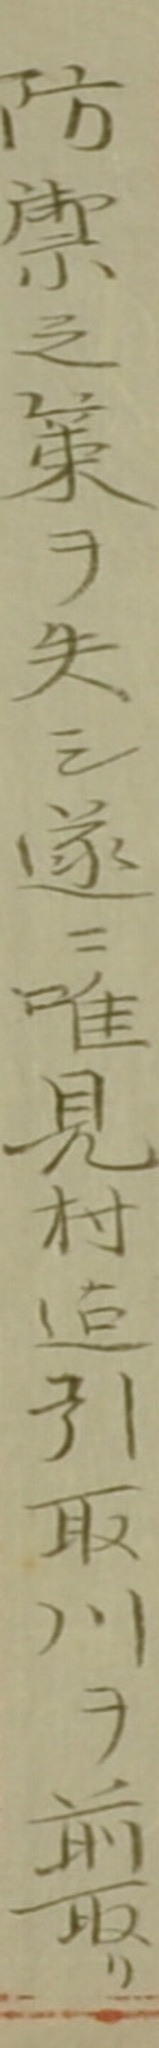防禦之策ヲ失シ遂ニ唯見村迄引取川ヲ前取リ
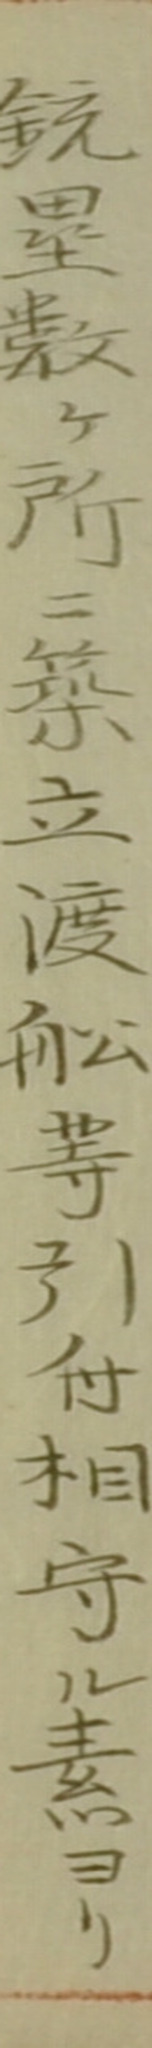銃塁数ヶ所ニ築立渡船等引付守ル素ヨリ
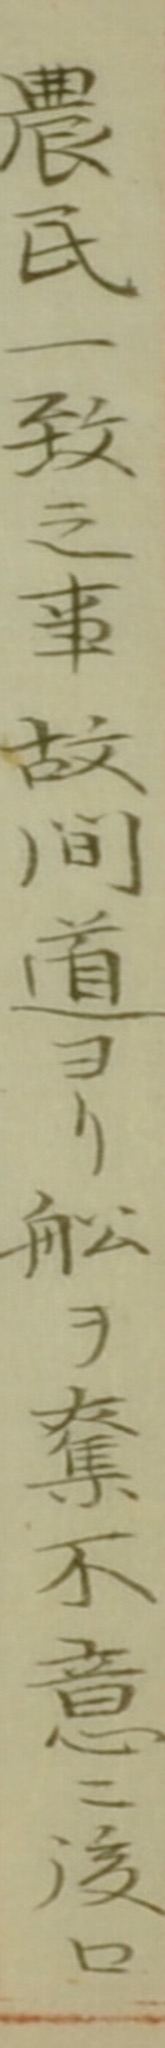農民一致之事故間道ヨリ船ヲ奪不意ニ後ロ
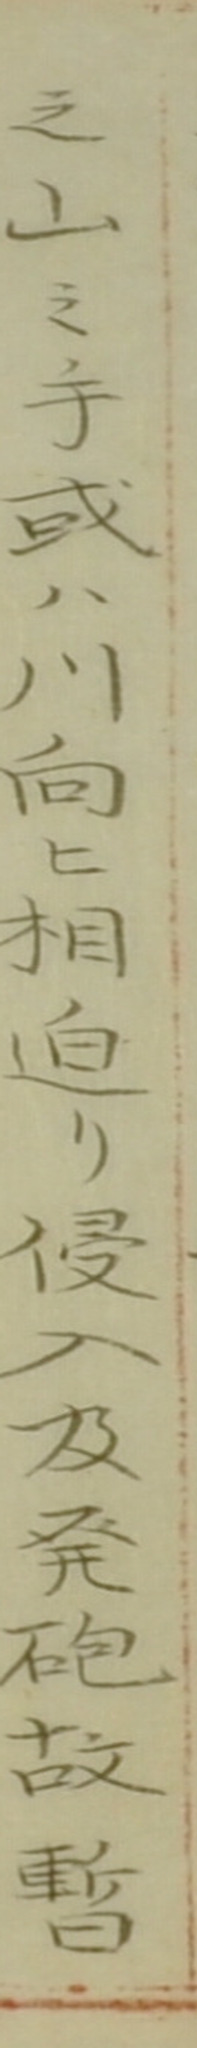之山之手或ハ川向ヒ相迫リ侵入及発砲故暫
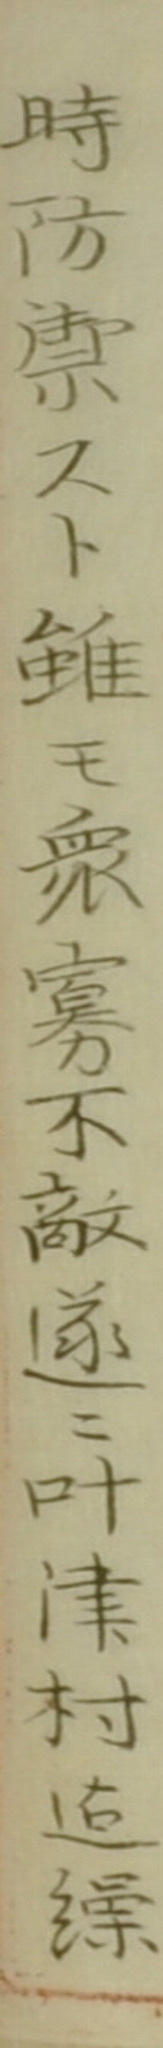時防禦スト雖モ衆寡不敵遂ニ叶津村迄繰
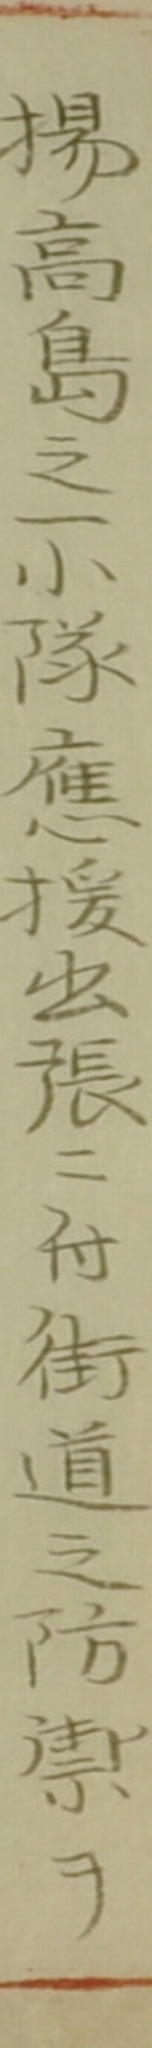揚高島之一小隊応援出張ニ付街道之防禦ヲ
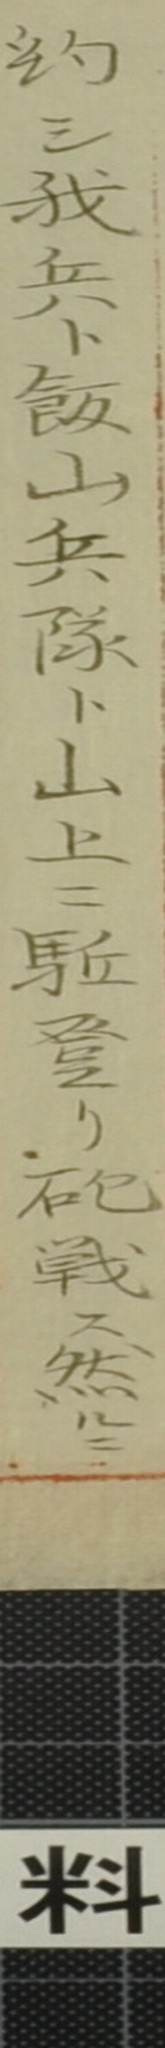約シ我兵ト飯山兵隊ト山上ニ駈登リ砲戦ス然ルニ
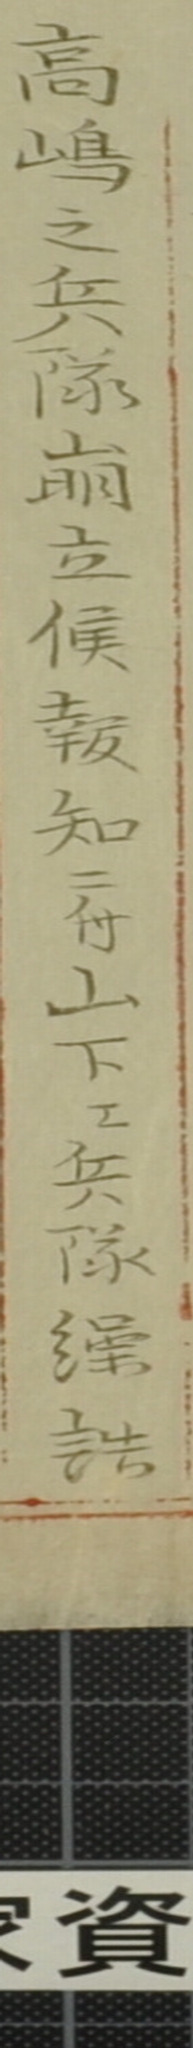高嶋之兵隊崩立候報知ニ付山下エ兵隊繰詰
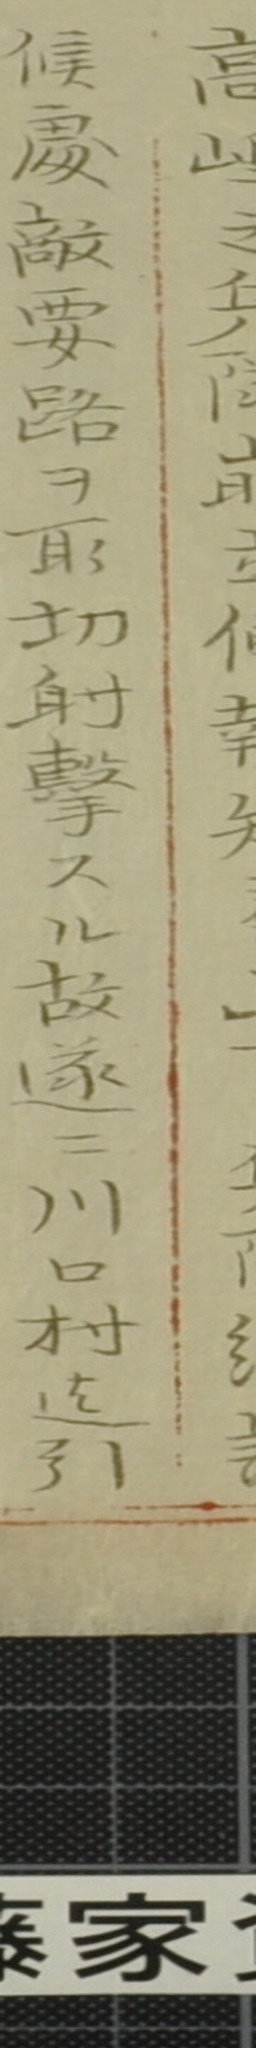候処敵要路ヲ取功射撃スル故遂ニ川口村迄引
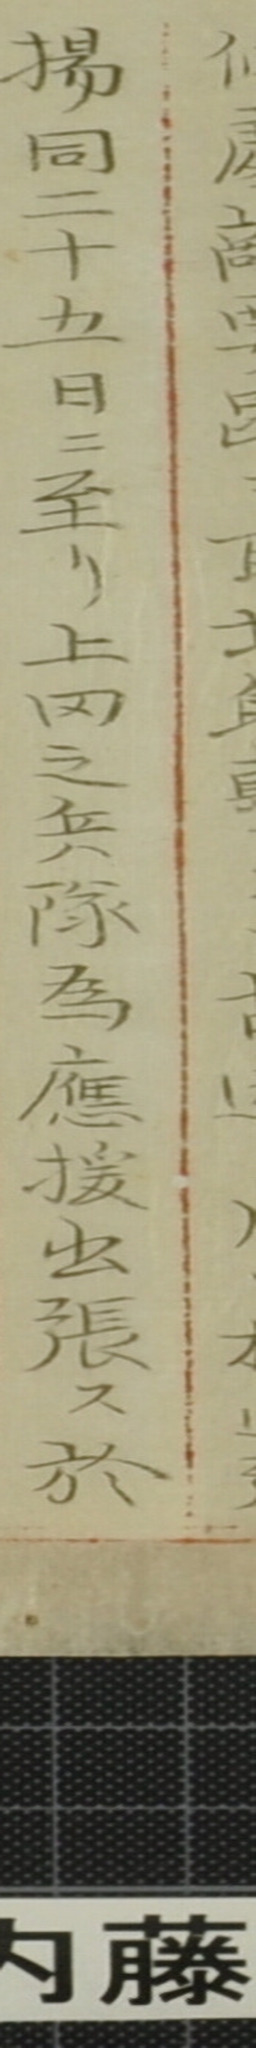揚同二十五日ニ至リ上田之兵隊為応援出張ス於
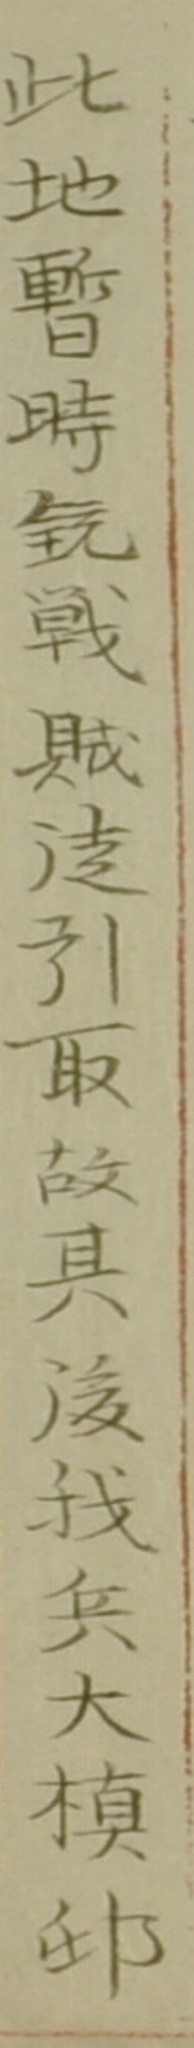此地暫時銃戦賊徒引取故其後我兵大槙邨
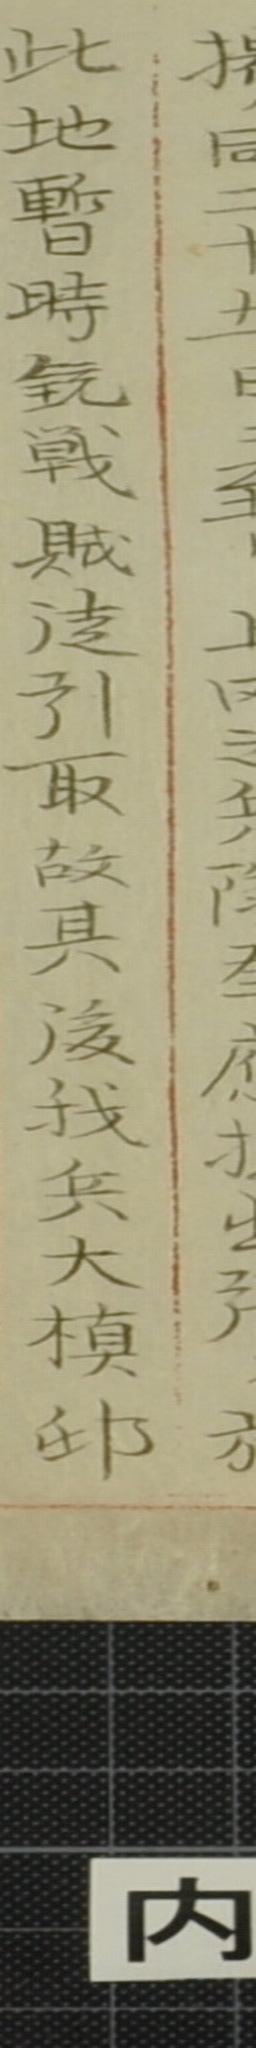此地暫時銃戦賊徒引取故其後我兵大槙邨
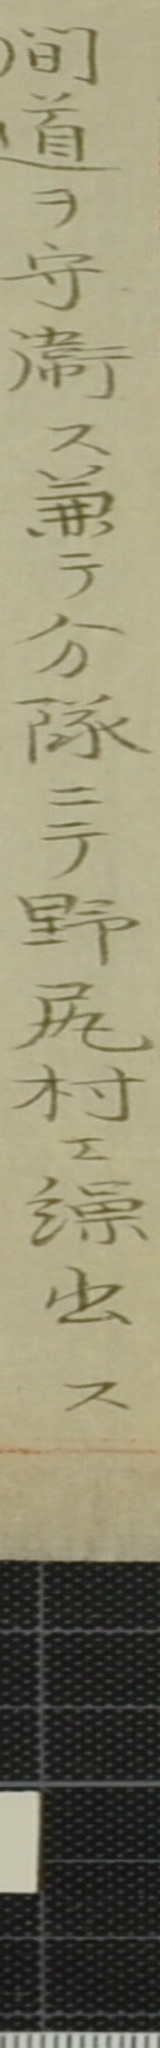間道ヲ守衛ス兼テ分隊ニテ野尻村エ繰出ス
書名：奥越出兵中戦争之事件概略抄録（控）
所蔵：伊那市立高遠町図書館・合同会社AMANE
